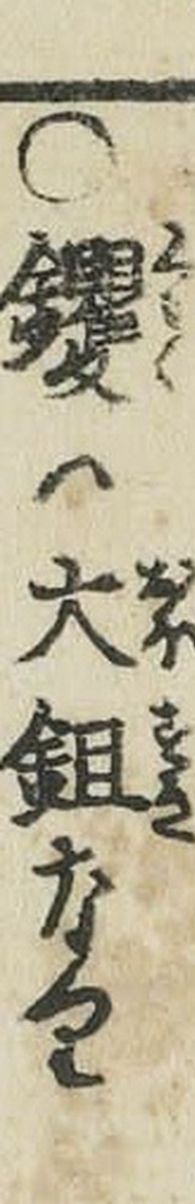○钁は大鉏なり
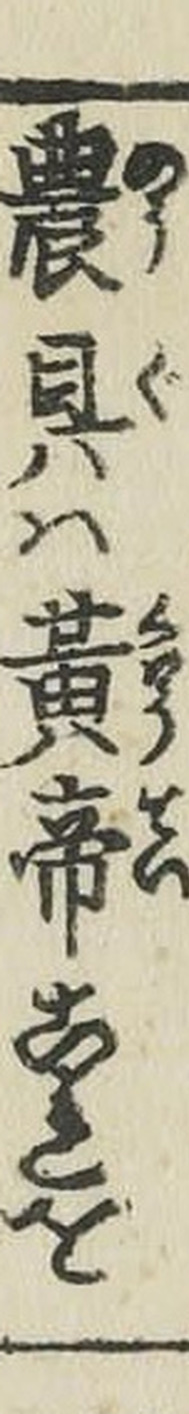農具は黄帝これを
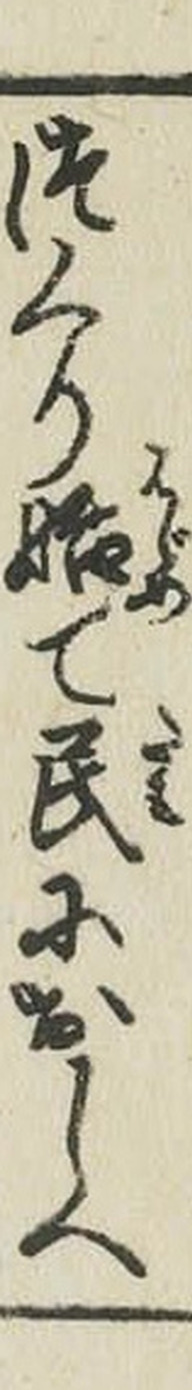つくり初て民におしへ
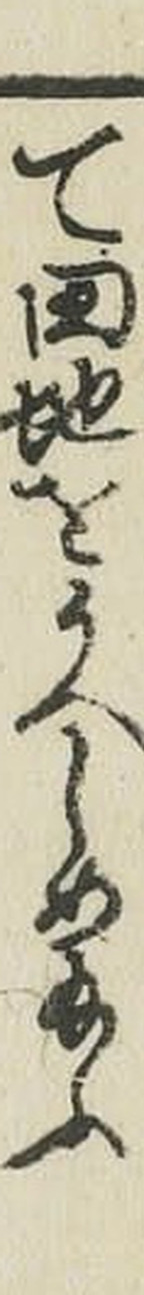て田地をうへしめ給ふ
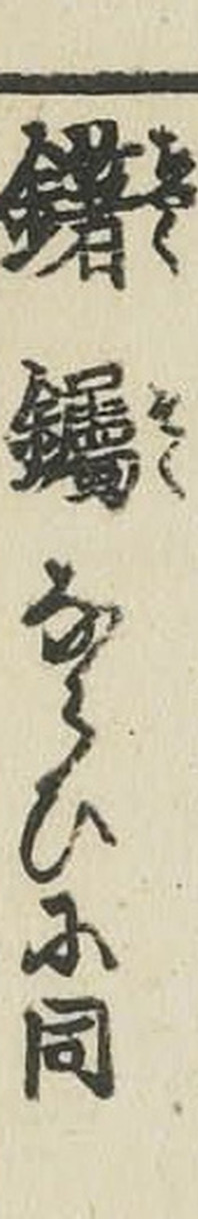鐯钃ならひに同
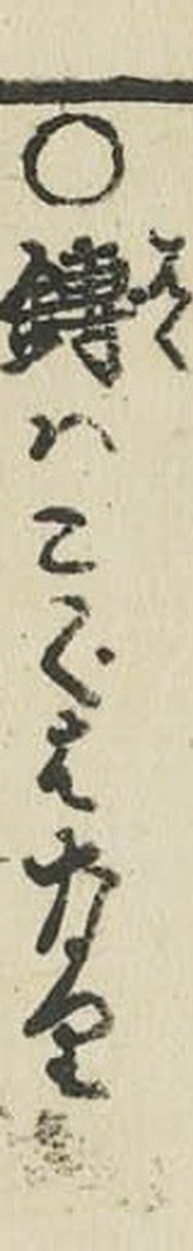○鏄はこぐはなり
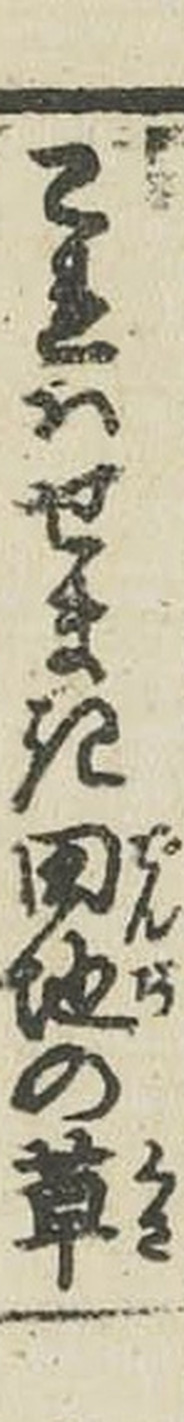これはせまき田地の草
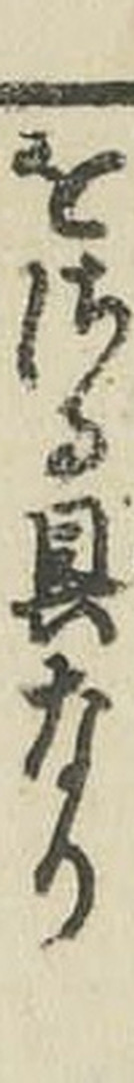をさる具なり
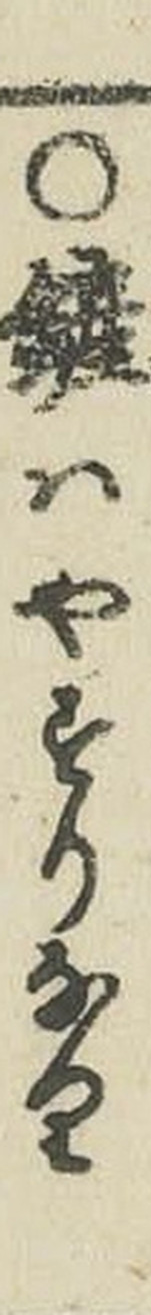○鏟はやすりなり
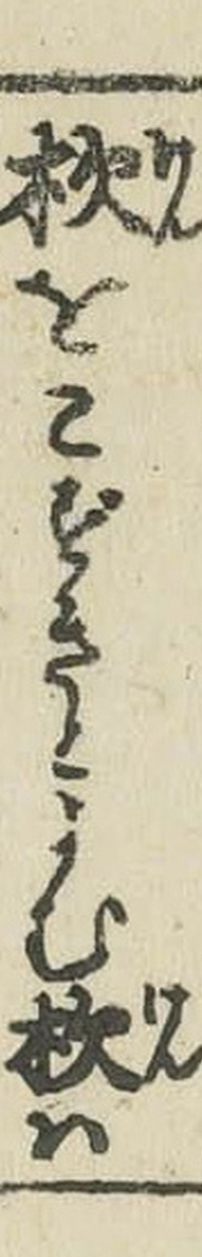杴をこずきとよむ杴は
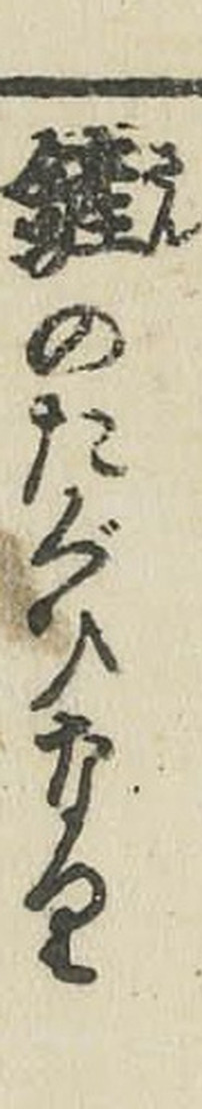鏟のたぐひなり
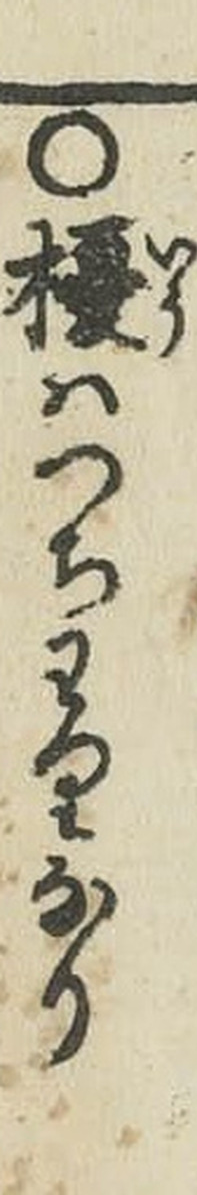○櫌はつちわりなり
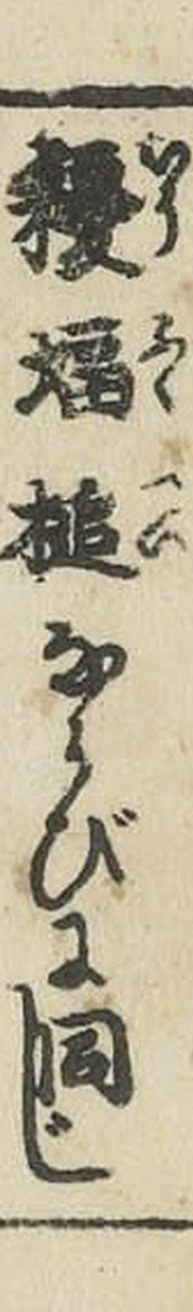耰堛槌ならびに同じ
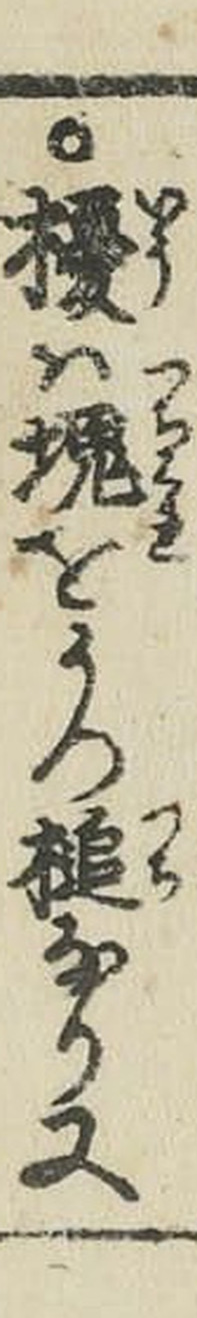櫌は塊をうつ槌なり又
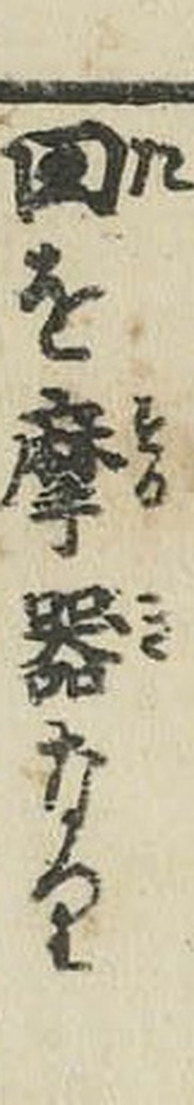田を摩器なり
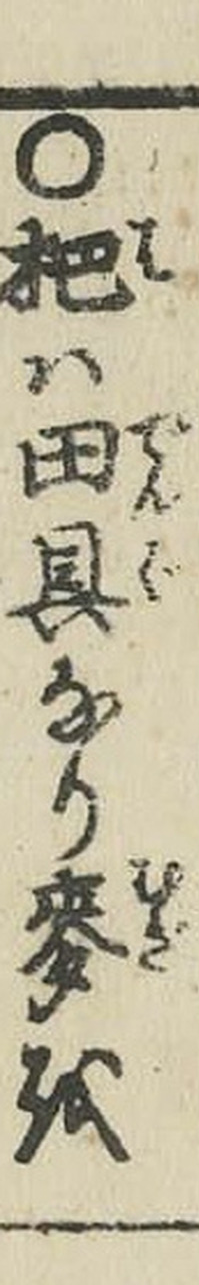○杷は田具なり麦を
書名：増補頭書訓蒙図彙大成 10巻 5:巻之9-11
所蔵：東京学芸大学教育コンテンツアーカイブ
